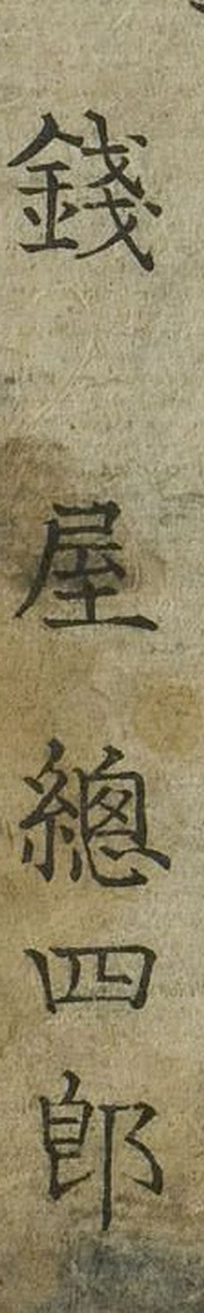銭屋総四郎
